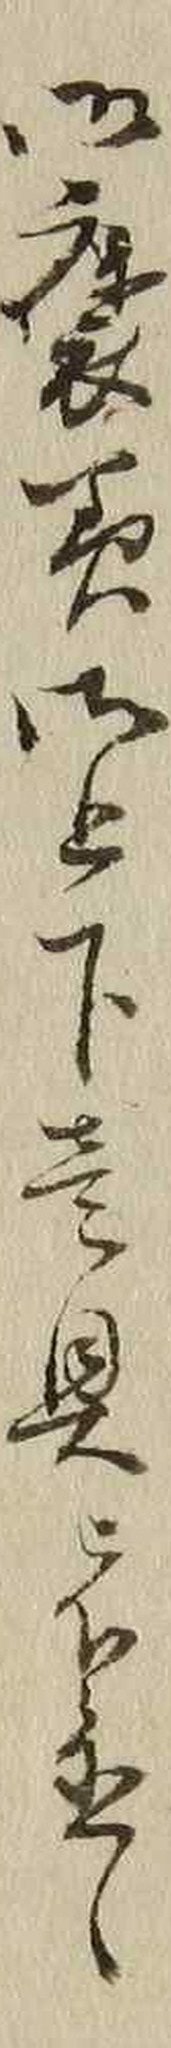御褒美御上下壱具被下置候
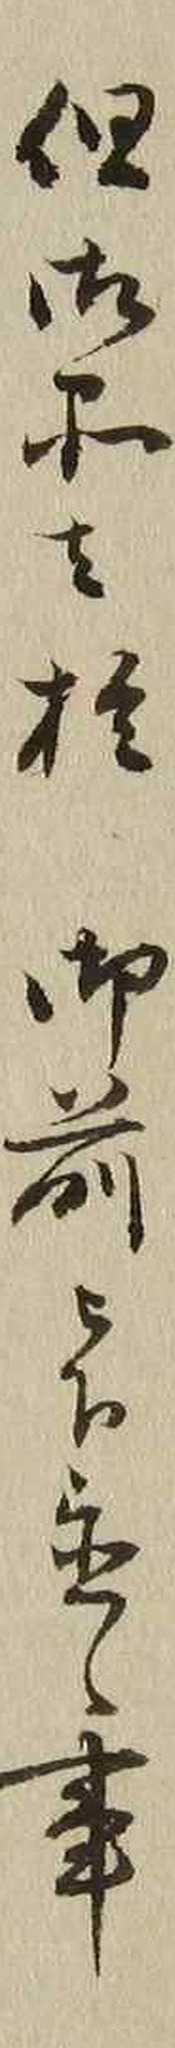但御品者於御前被下置候事
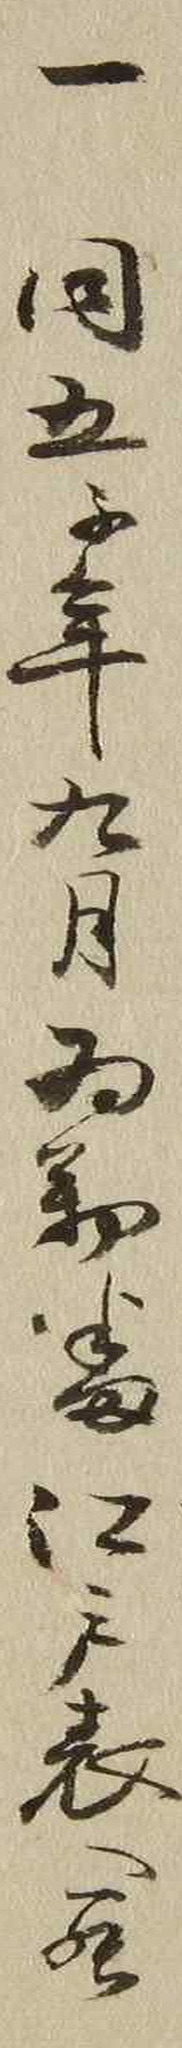一同五子年九月為勤番江戸表へ罷
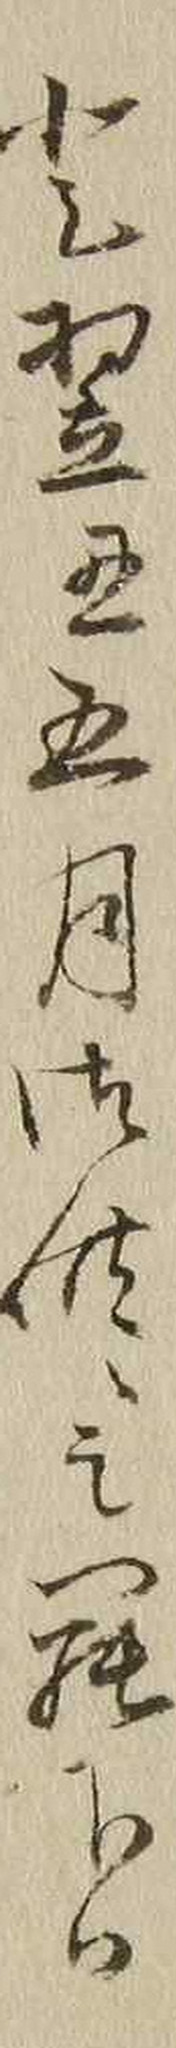登翌丑五月御供ニ而罷下候
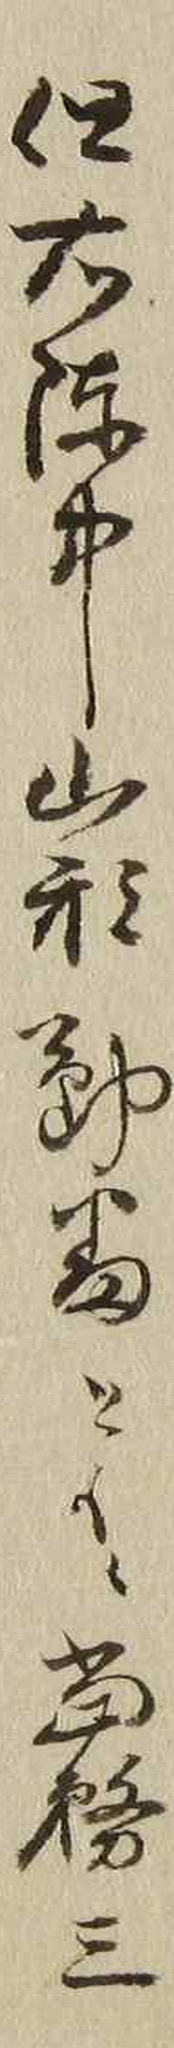但右陣中山形勤番ともニ当務三
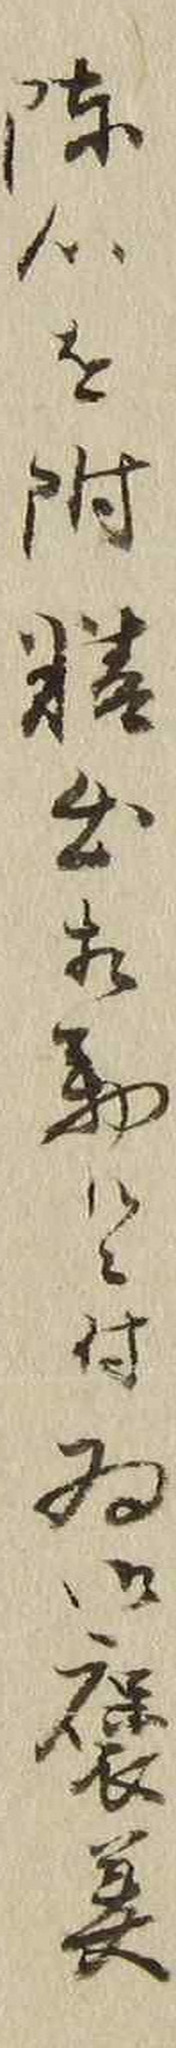陣心を附精出相勤候ニ付為御褒美
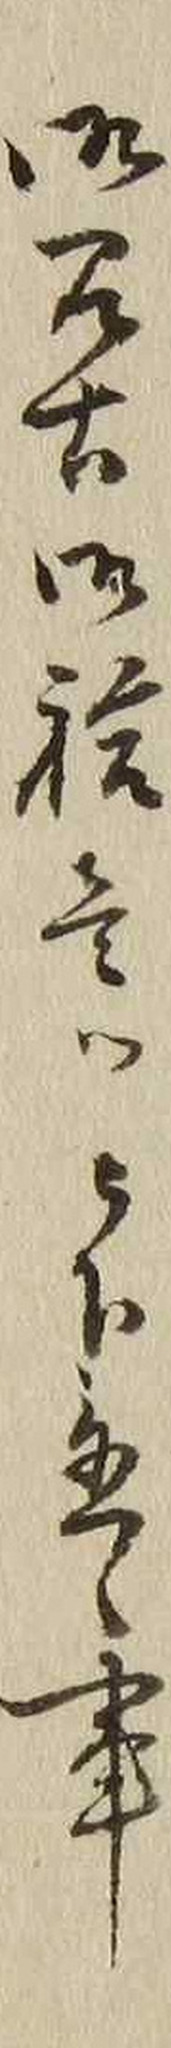御召古御袷壱ツ被下置候事
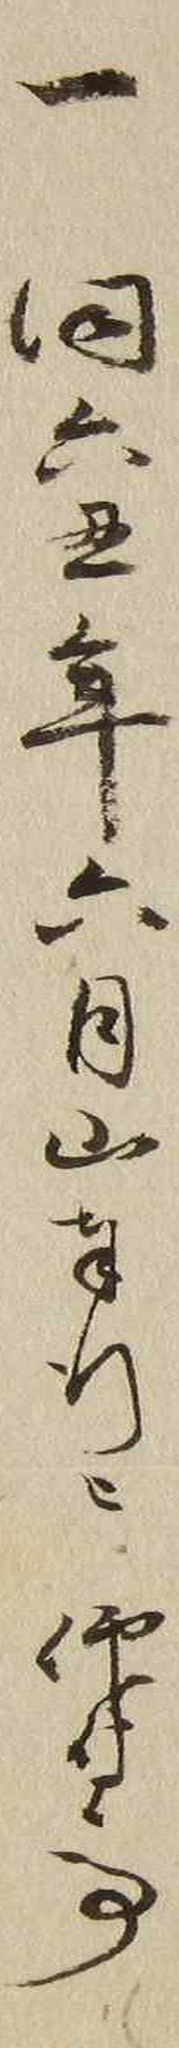一同六丑年六月山奉行被仰付候事
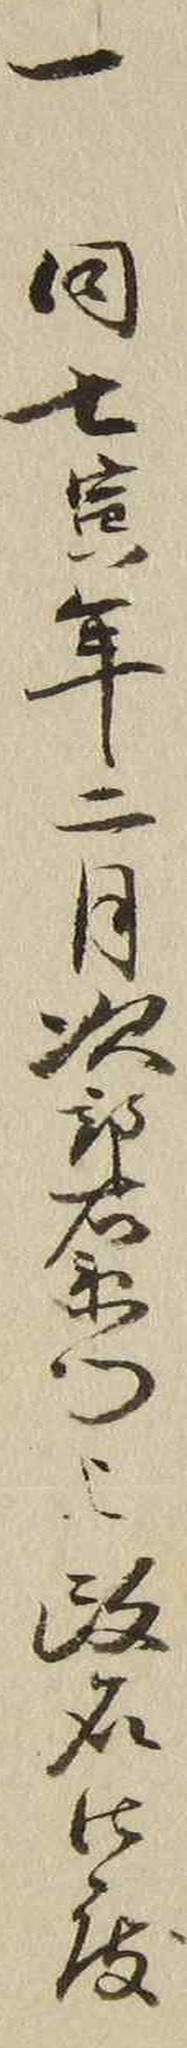一同七寅年二月次郎右衛門与改名仕度
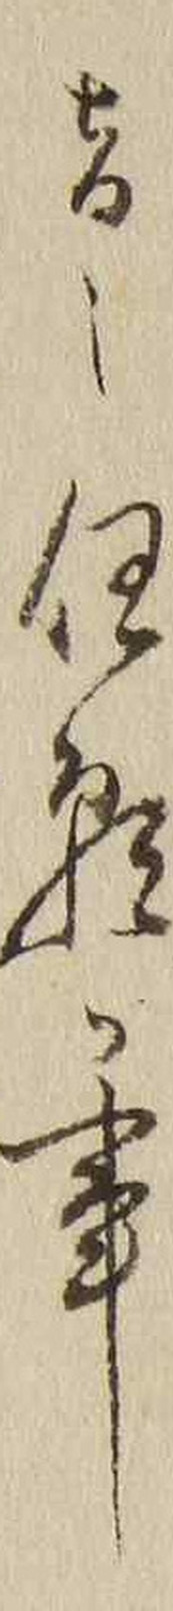旨之任願候事
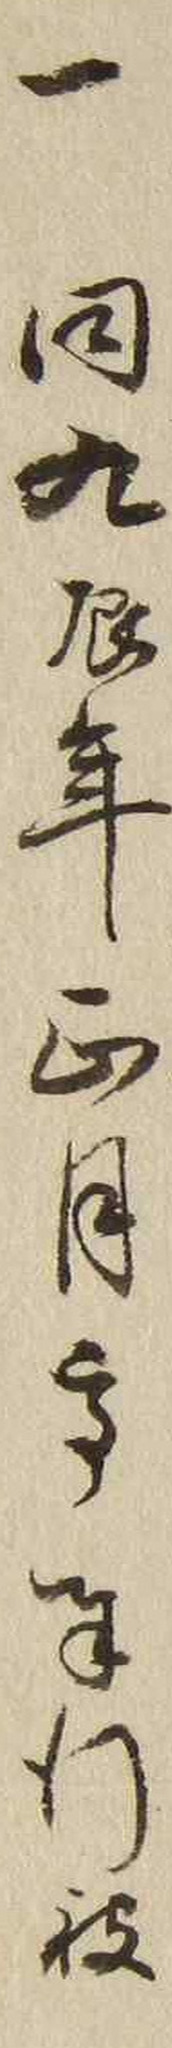一同九辰年正月高奉行被

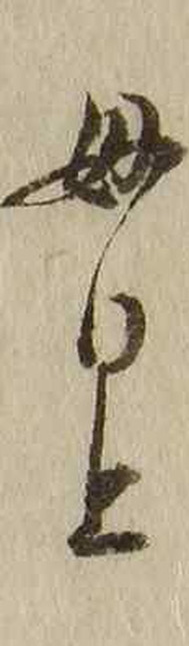母同上
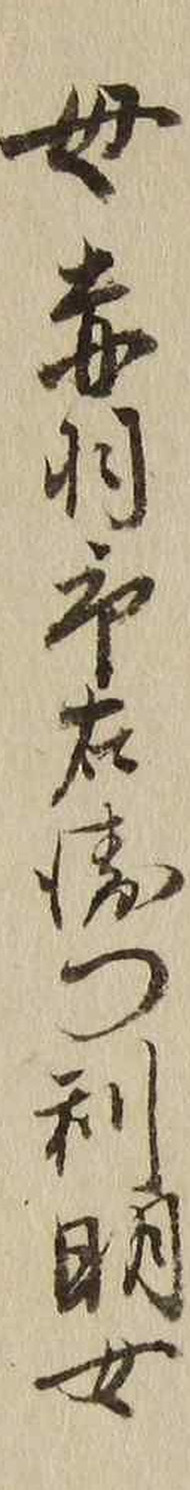母赤羽市右衛門利明女
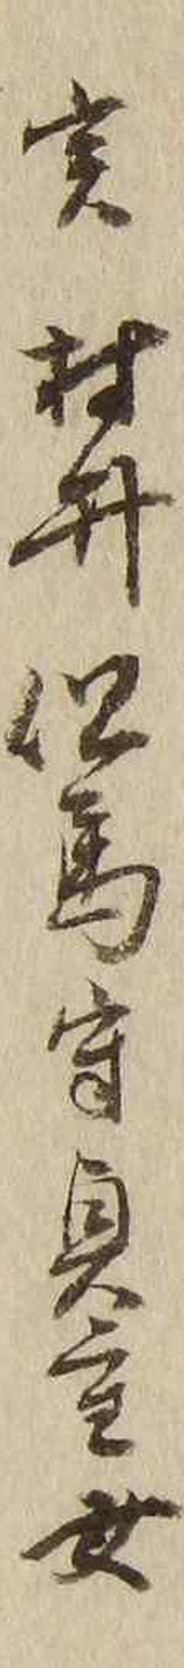実村井但馬守貞重女

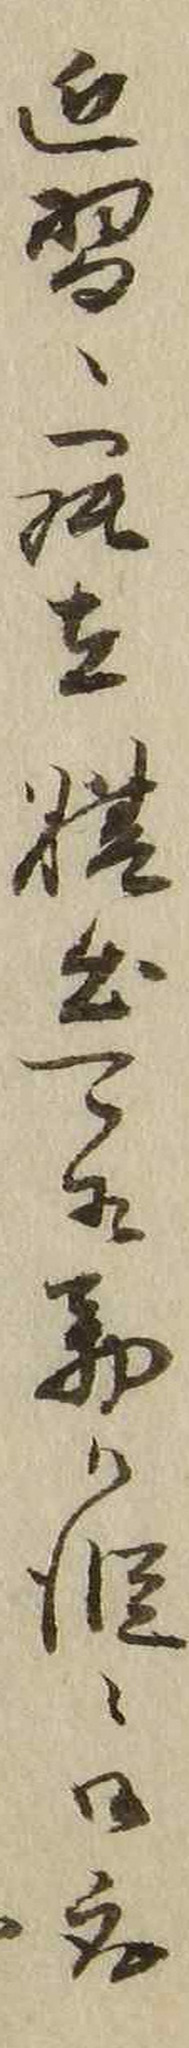近習へ罷在精出可相勤候段ニ御取
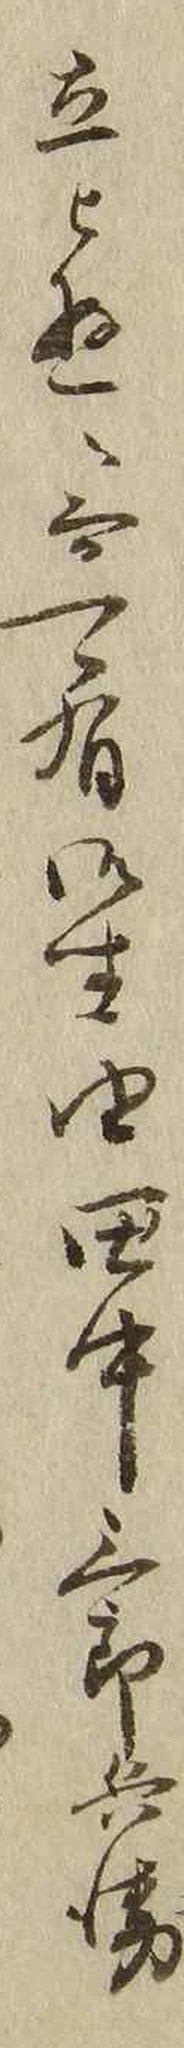立被遊候而可有御生由田中三郎兵衛
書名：諸士系譜　巻之225　ま之部6
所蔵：会津若松市立会津図書館
